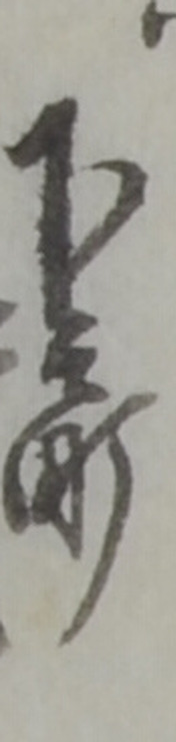下モ町
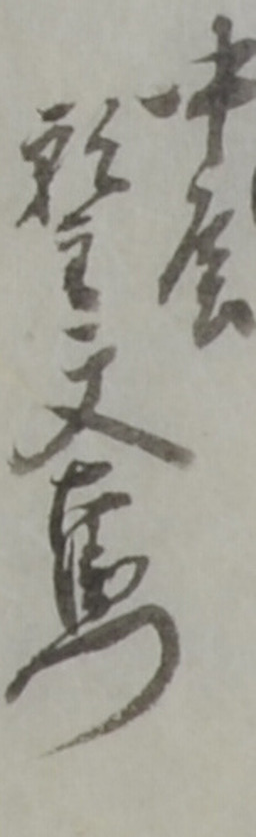願主文右衛門
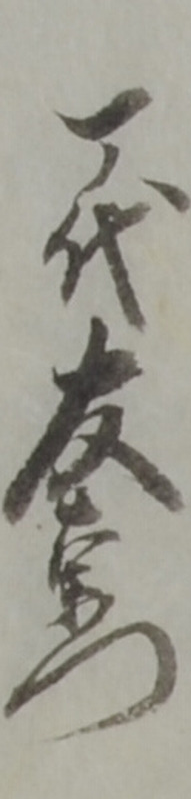丁代友右衛門
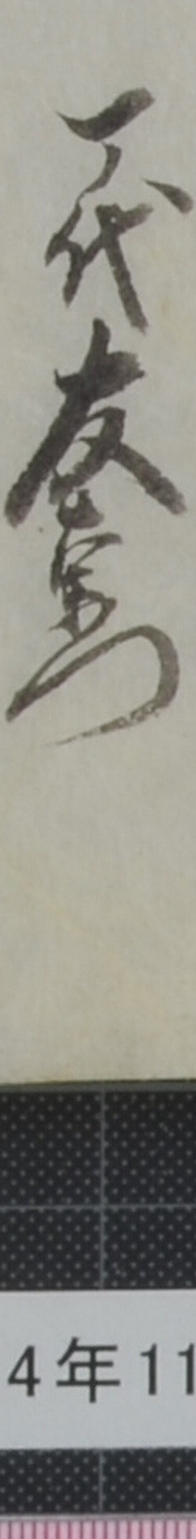丁代友右衛門
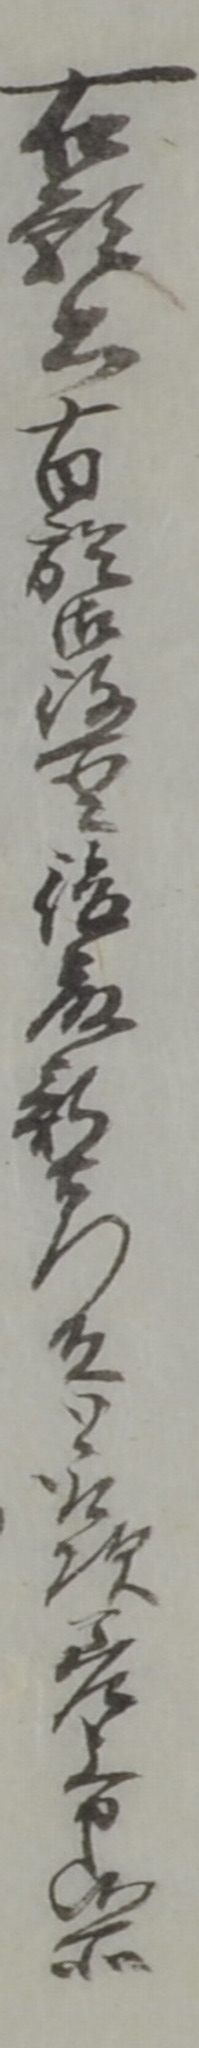右願書十日於御役所ニ後藤新右衛門殿御取次差上申候所
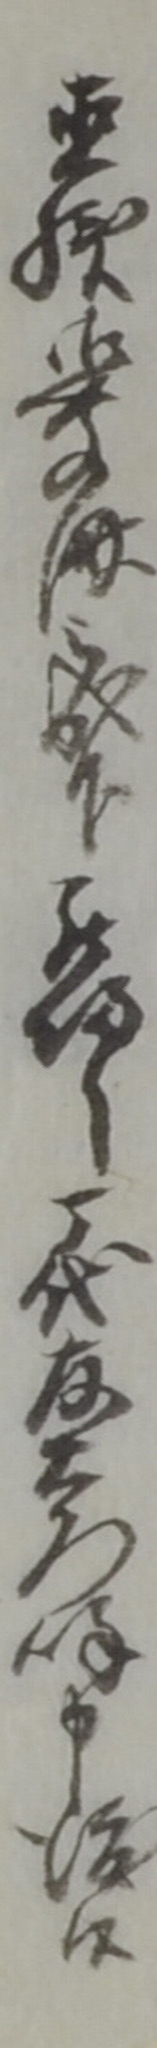直様御聞済被成下罷帰り丁代友右衛門呼申渡候
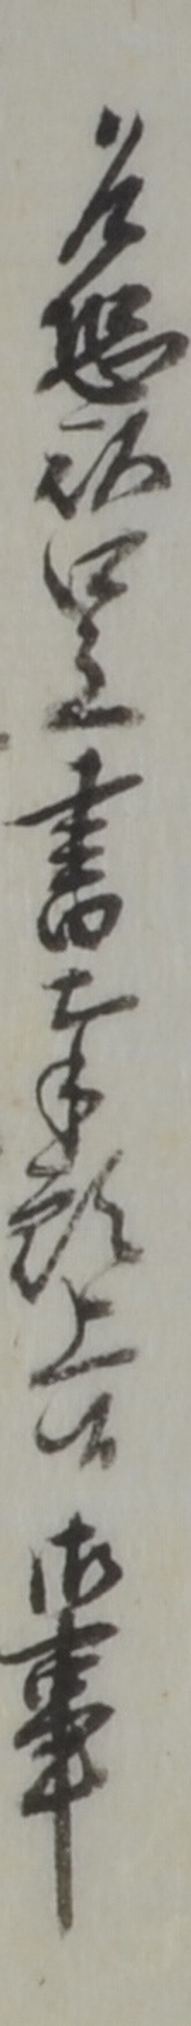乍恐以口上書奉願上候御事
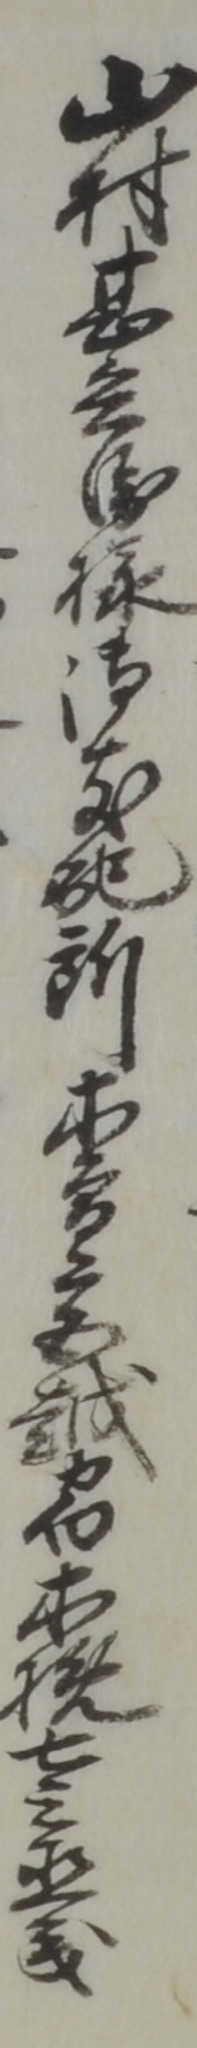山村甚兵衛様御支配所木曽宮越宿木挽七之丞義
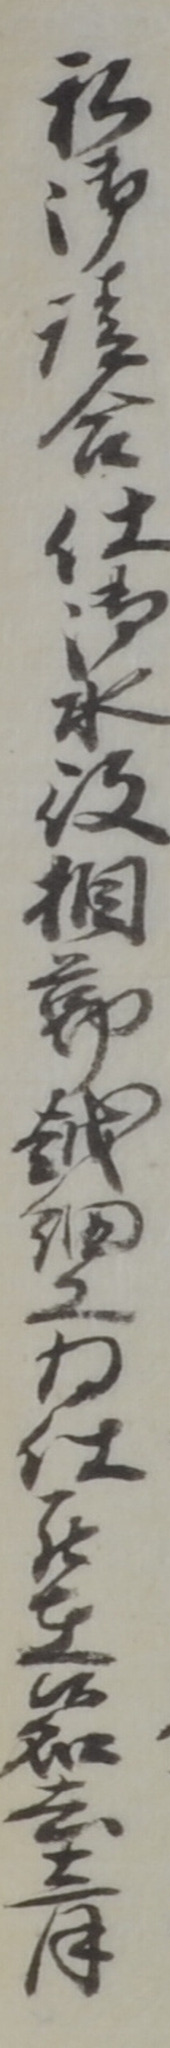私御請合仕御水役相勤越細工為仕罷在候処去十ニ月
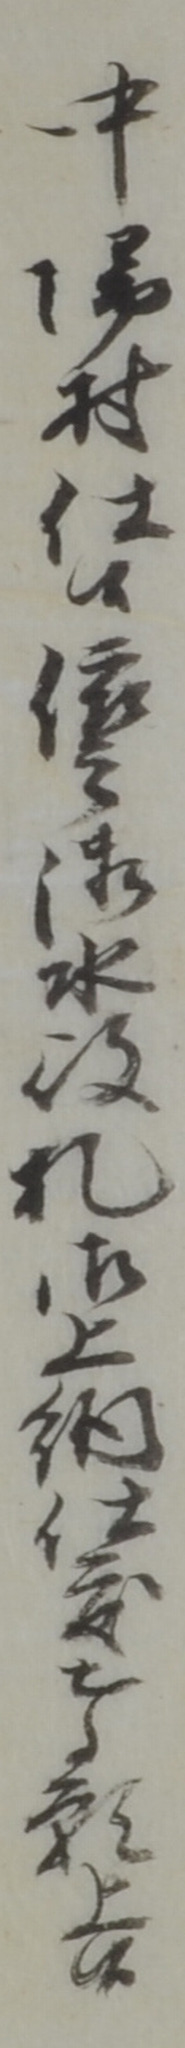中帰村仕候依之御水役札御上納仕度奉願上候
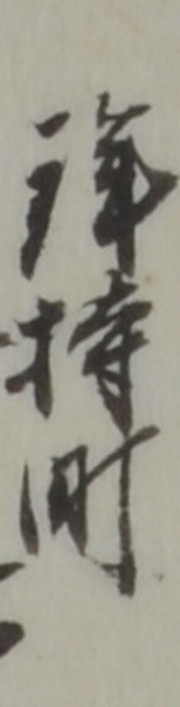鉾持町
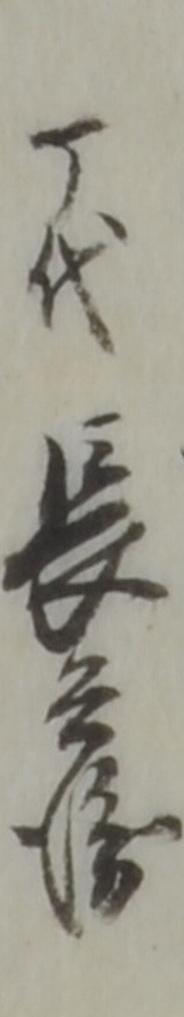丁代長兵衛
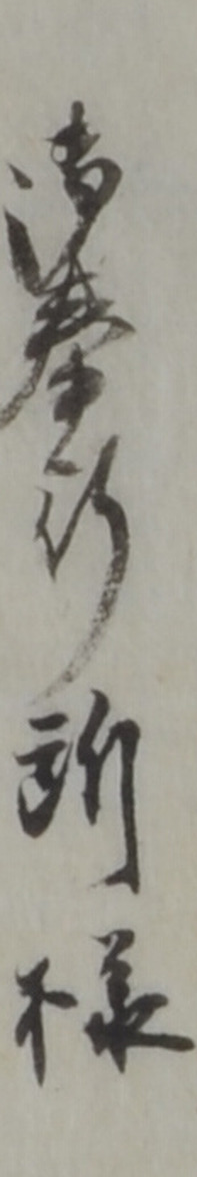御奉行所様
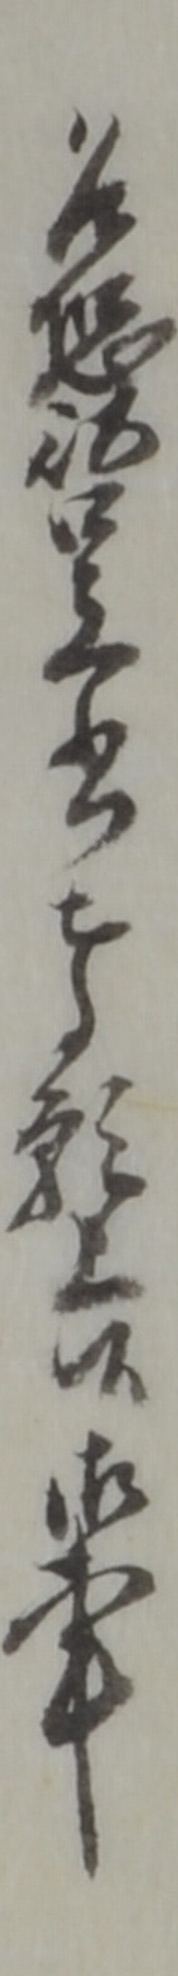乍恐以口上書奉願上候御事
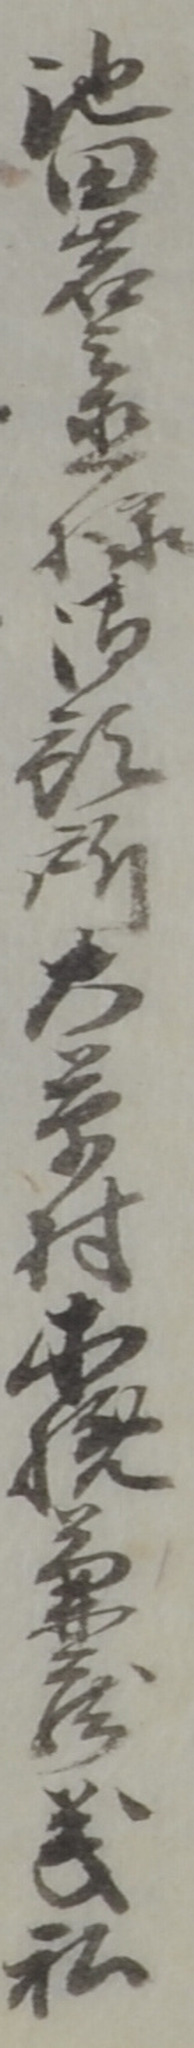池田岩之丞様御預所大草村木挽兼蔵義私
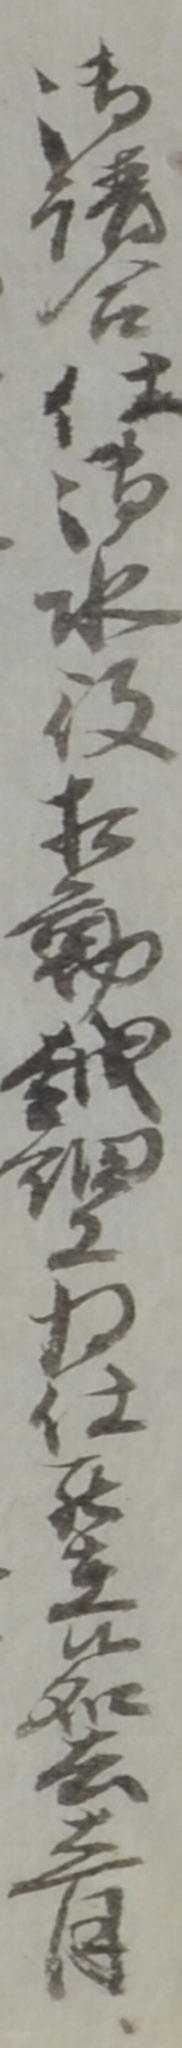御請合仕御水役相勤越細工為仕罷在候処去十二月
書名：諸願書控簿
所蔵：伊那市立高遠町図書館・合同会社AMANE
